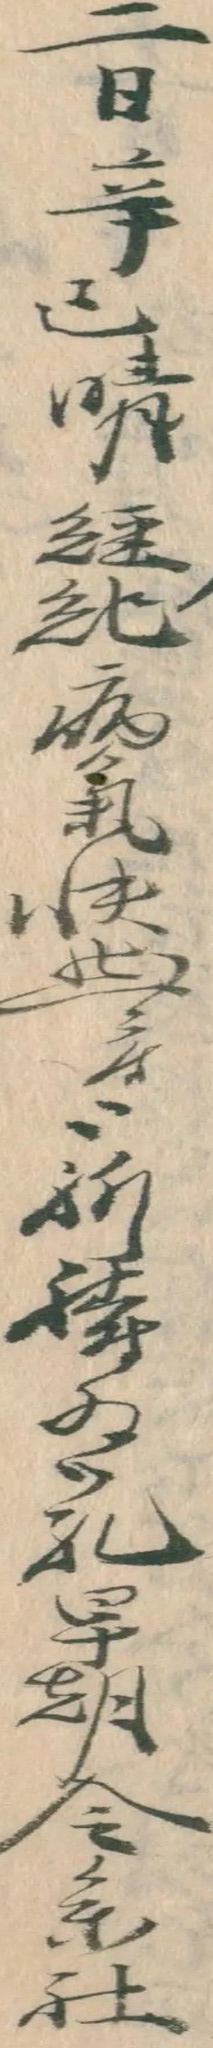二日辛巳晴経紀病氣快然ニ付御祈祷為御礼早朝令参社
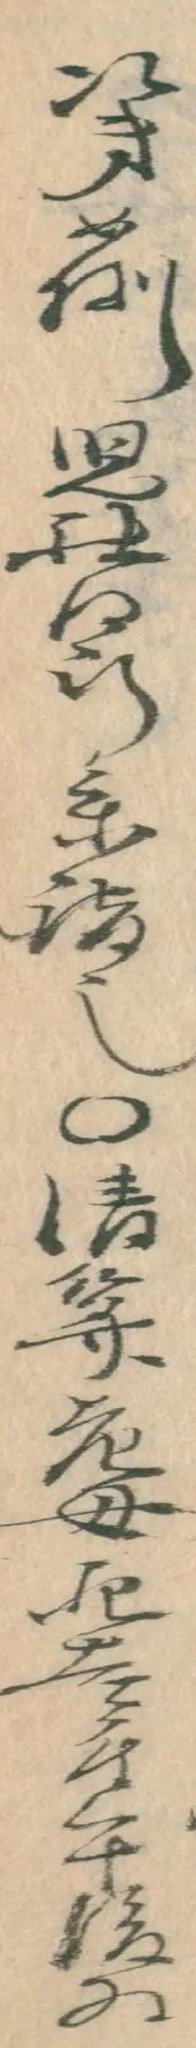次第如例児社同断参詣也○清算老母死去ニ付午後為

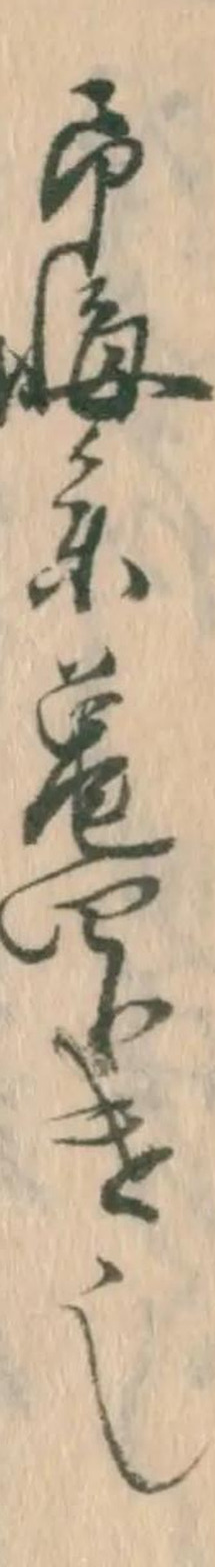即悔参亀四郎遣也
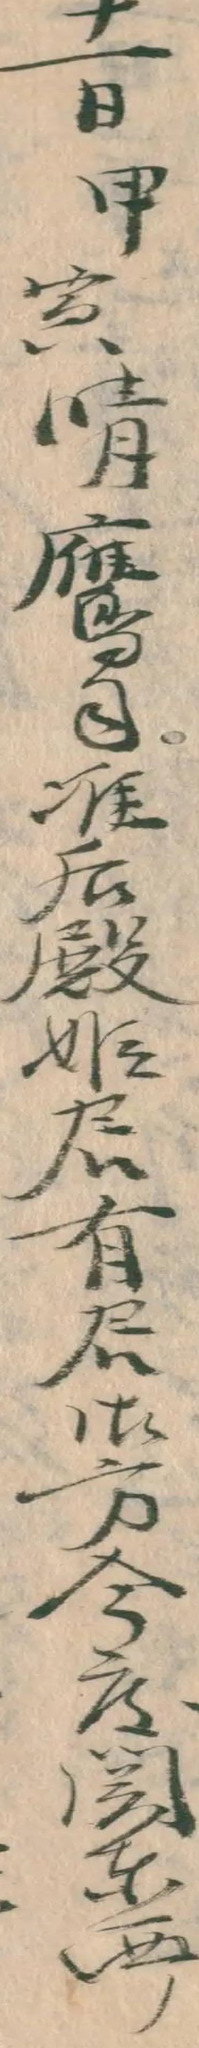十一日甲寅晴鷹司准后殿姫君有君御方今度関東西の
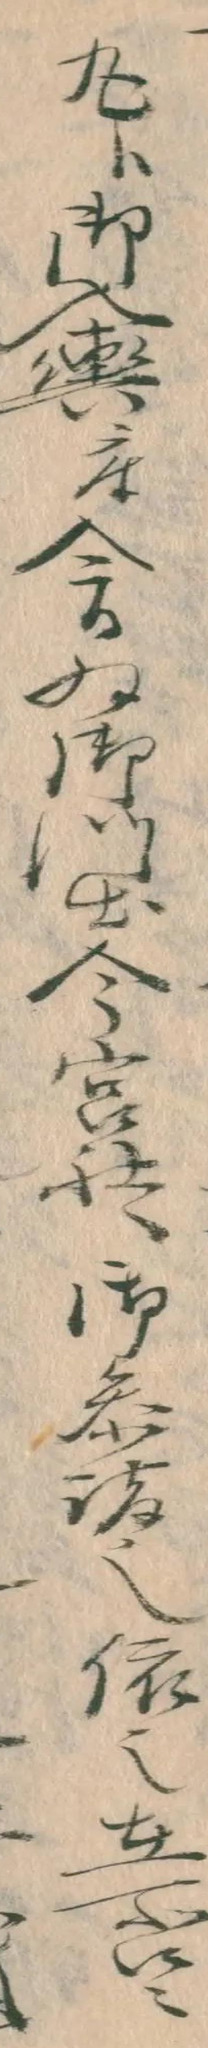丸え御入輿ニ付今日為御門出今宮社へ御参詣也依之在所口ニ
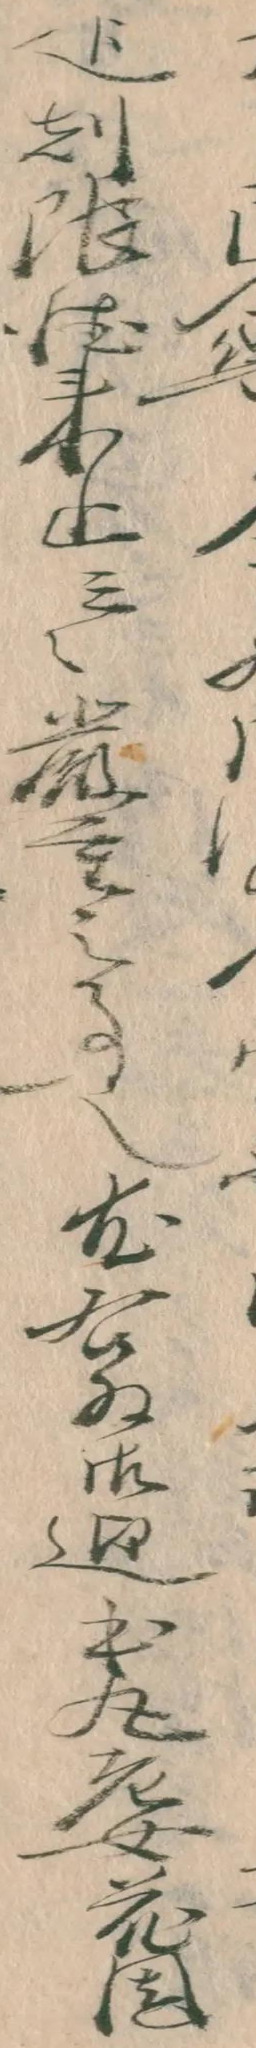迄刻限往来止云〻厳重之事也尤右為御迎本丸老女花園
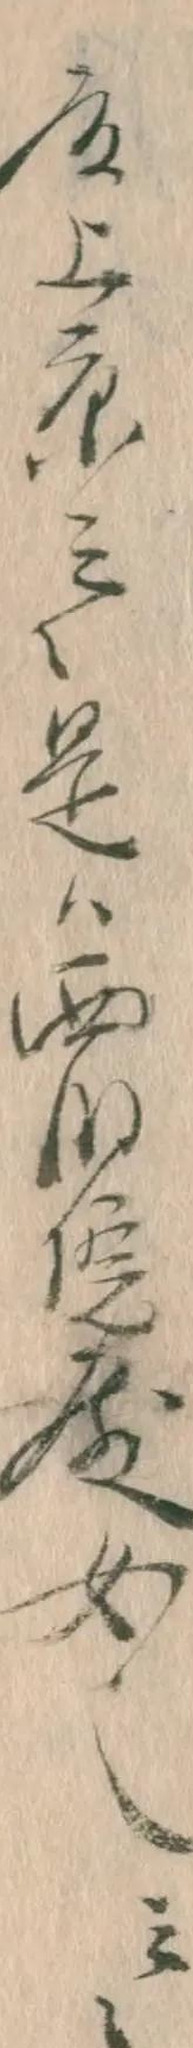殿上京云々是ハ西洞院殿女也云々
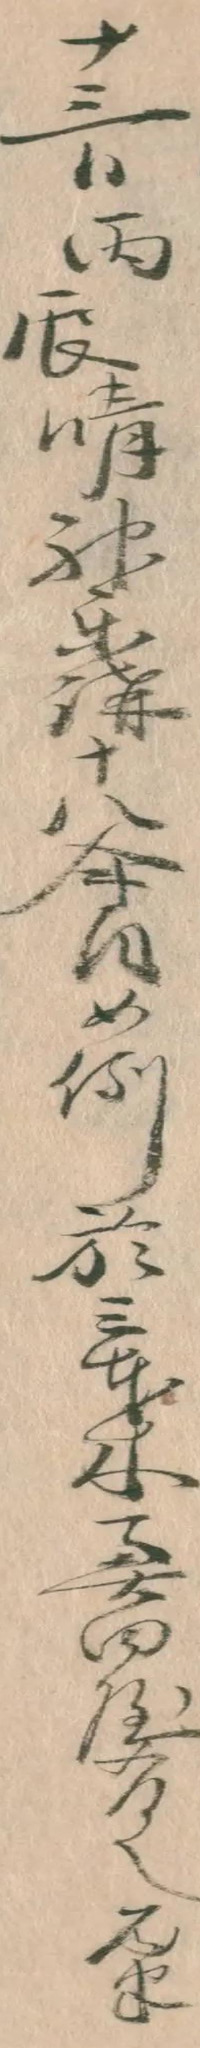十三日丙辰晴神楽講十八會目如例於三本木奥田屋有之酉半
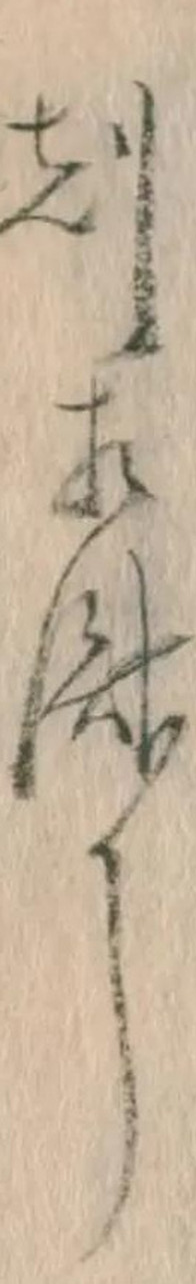刻相済了
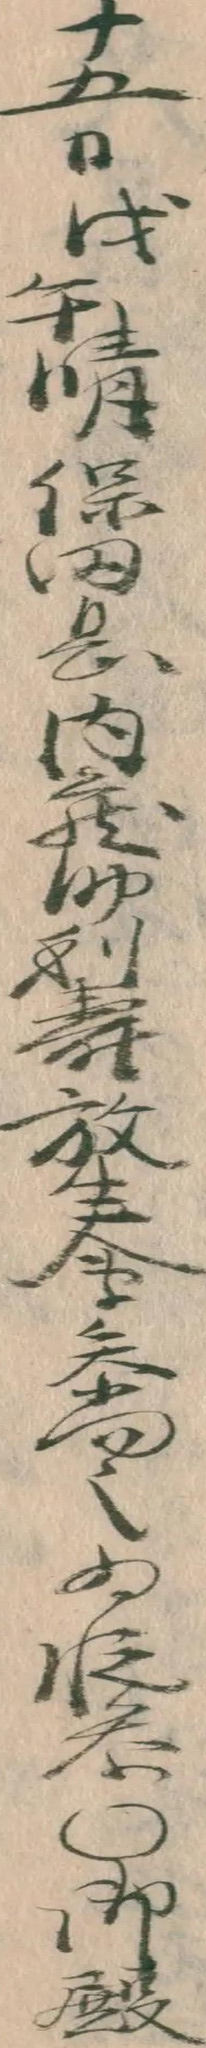十五日戊午晴保田息内蔵助利壽放生會参向也為祝参○御殿
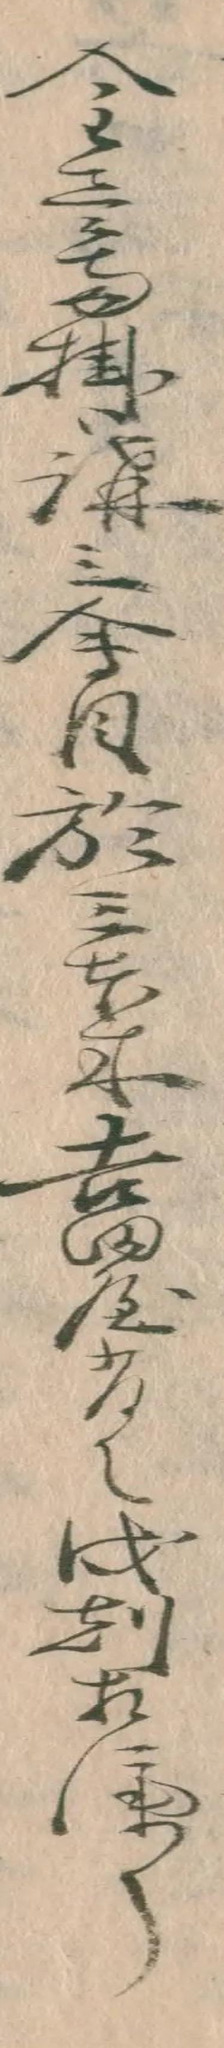金壱両掛御講三會目於三本木吉田屋有之戌刻相済了
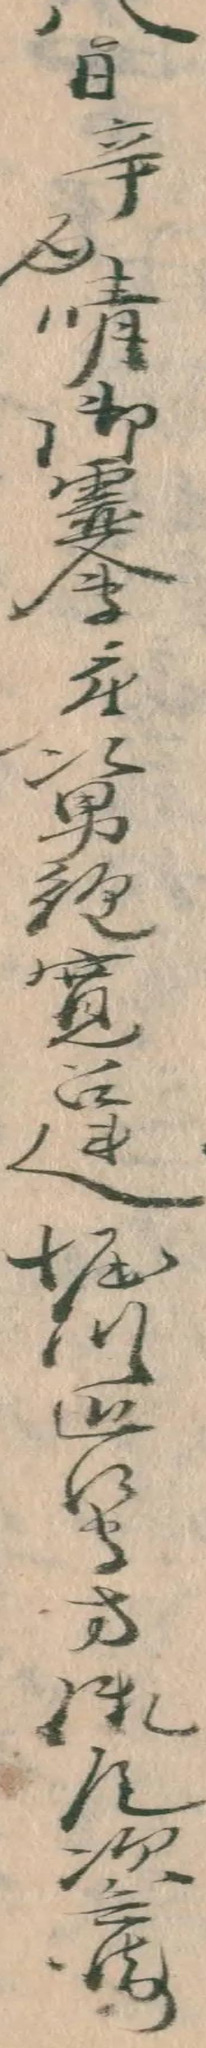十八日辛酉晴御霊會ニ付次男経寛召連堀川近江守方御屋次兵衛
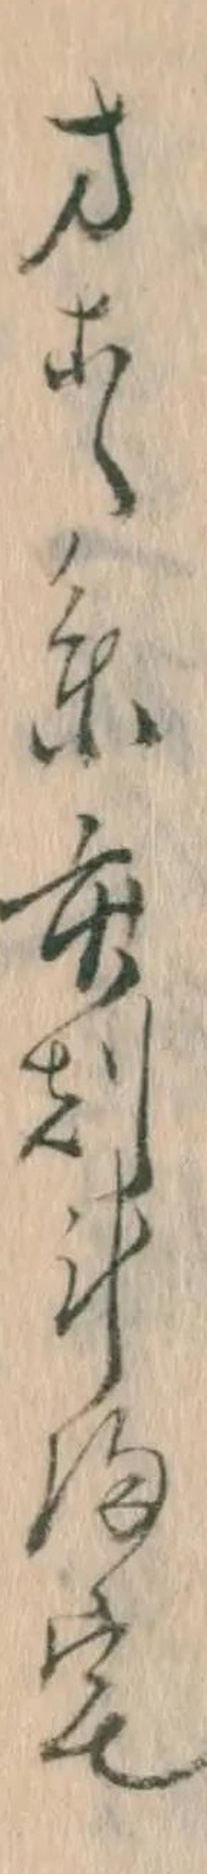方等へ参亥刻斗帰宅
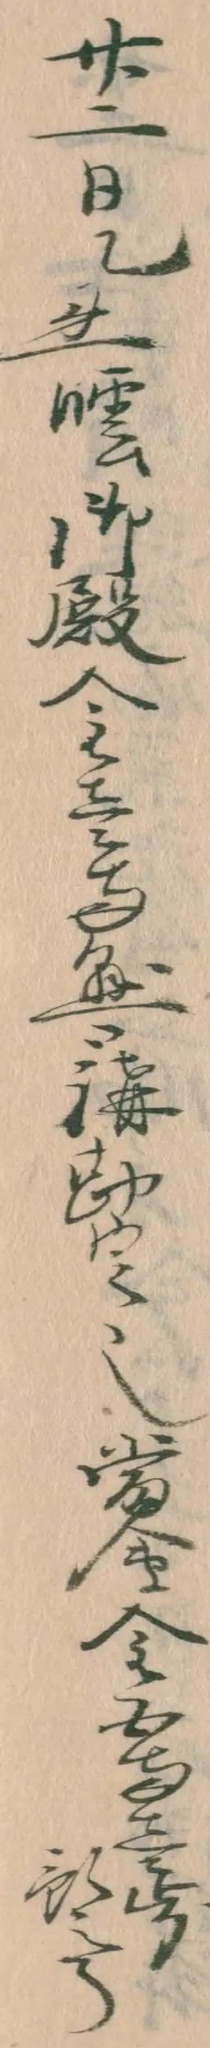廿二日乙丑曇御殿金壱両懸御講勘定也當會金五両三歩預之了
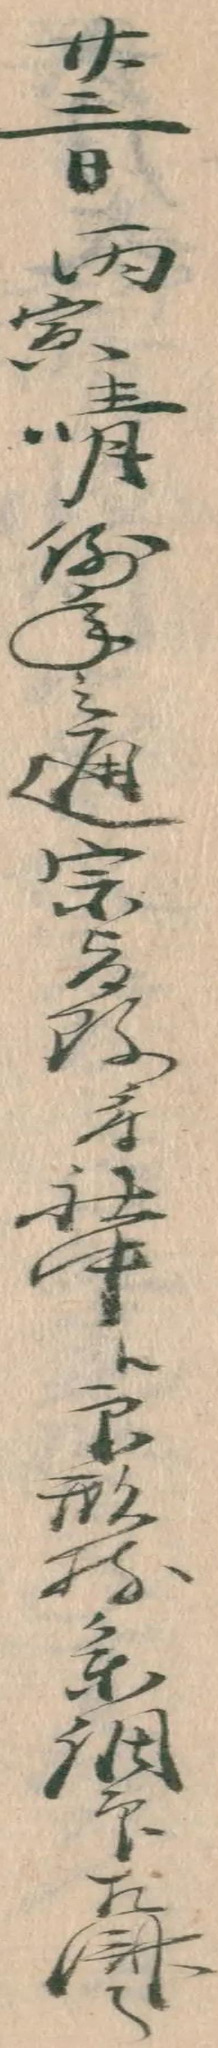廿三日丙寅晴例年之通宗旨改ニ付社中え印形持参調印相済了
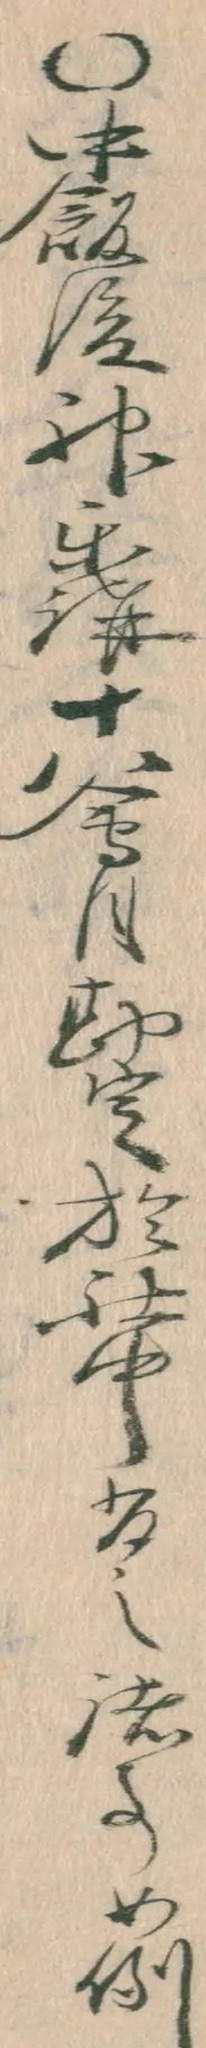◯中飯後神楽講十八會目勘定於社中有之諸事如例
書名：賀茂社記録. 第66冊
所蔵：国立国会図書館 National Diet Library, JAPAN
